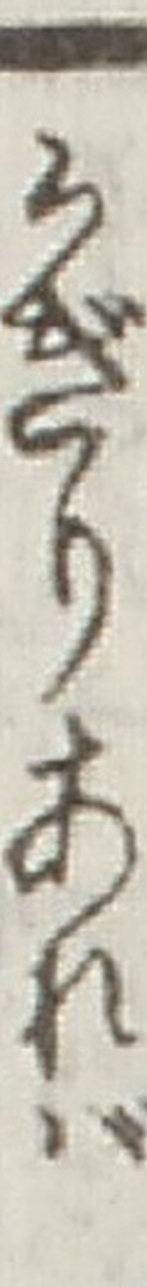かぎりあれば
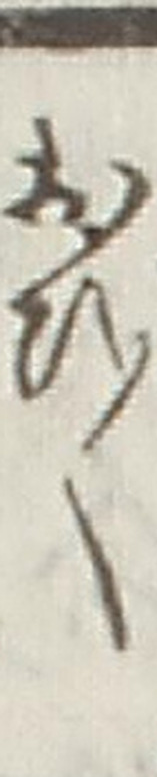おひ〳〵
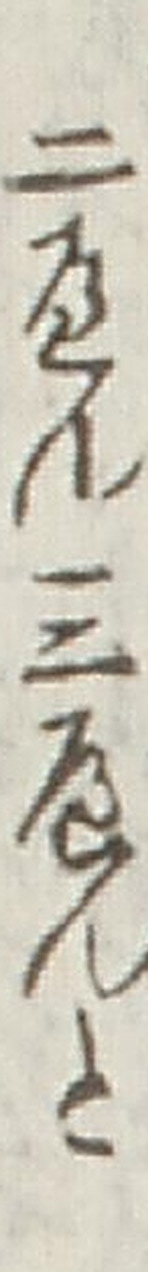二へん三へんと
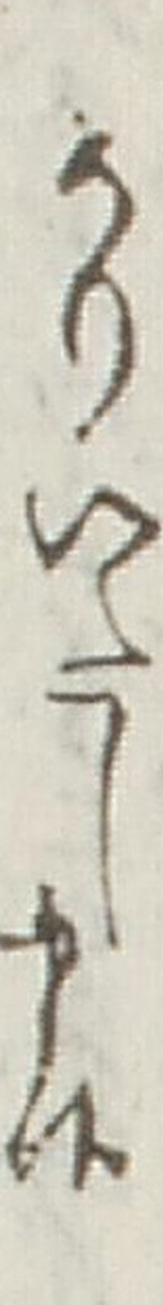うりいたし申候
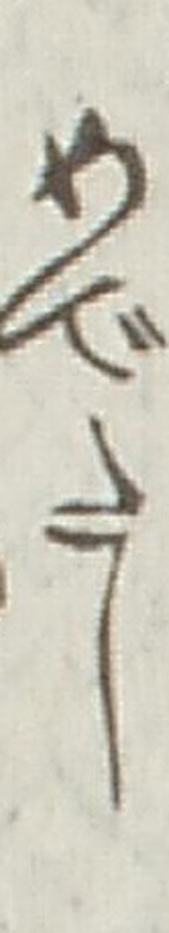めでたし

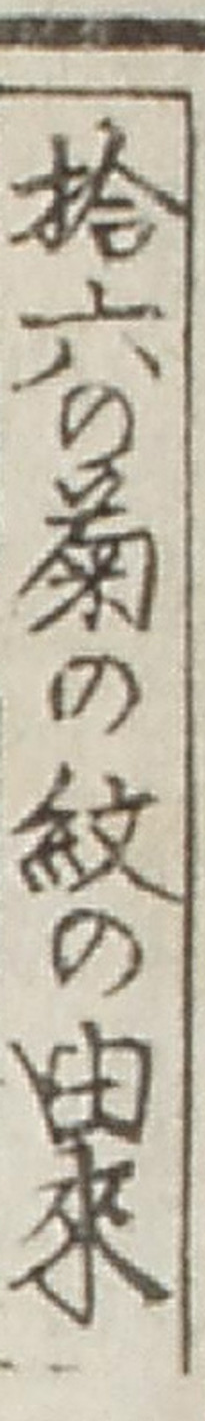拾六の菊の紋の由來
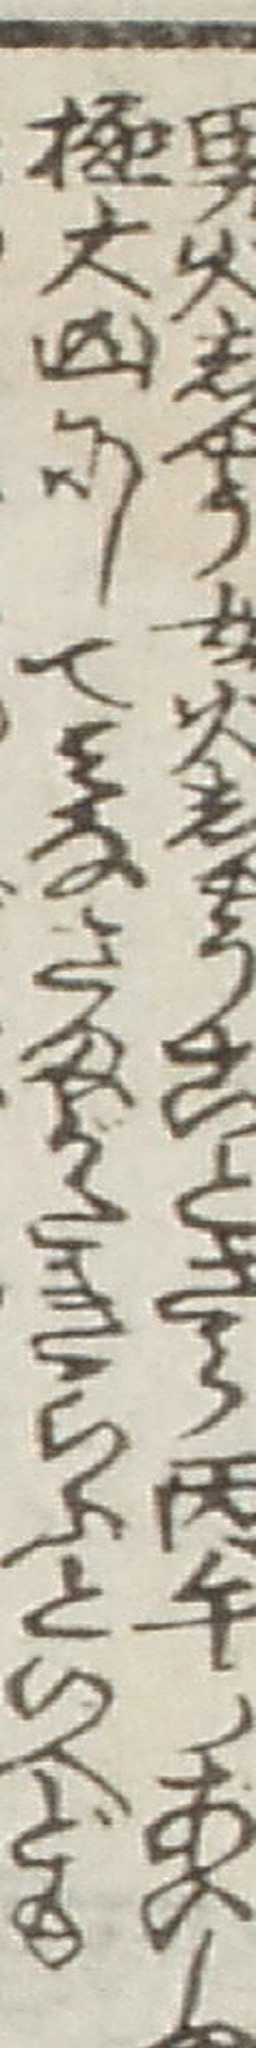極大凶にしてミなさまがたきらふといへども
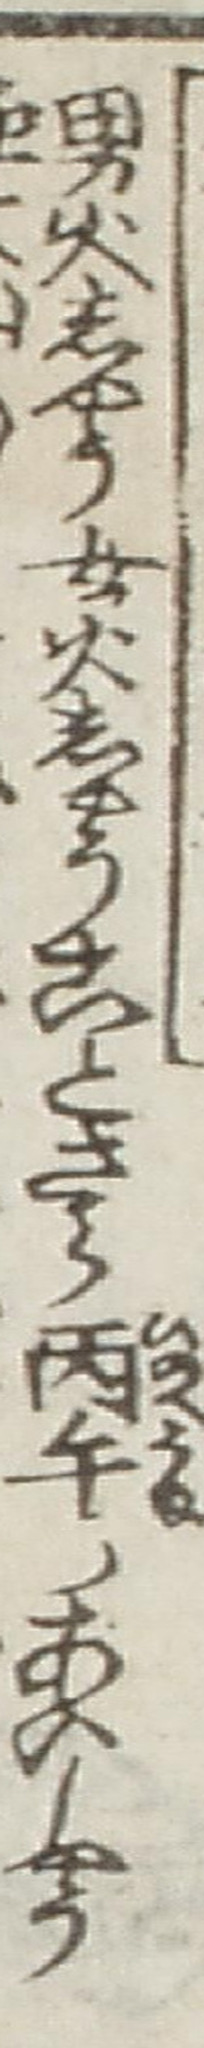男火しやう女火しやうことさら丙午ノあいしやう
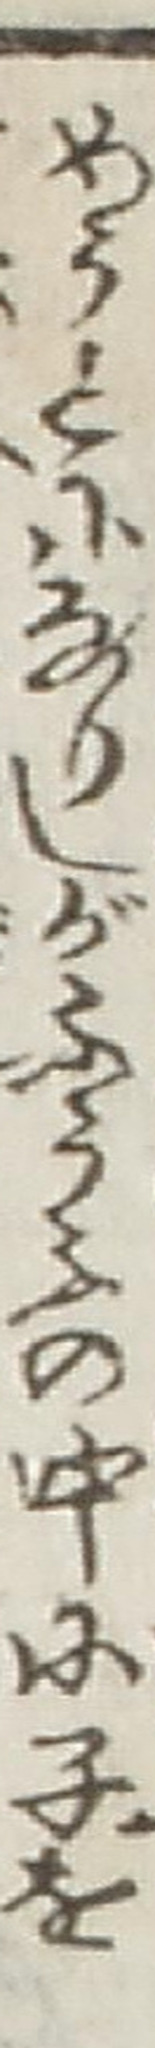めうとになりしがふうふの中に子を
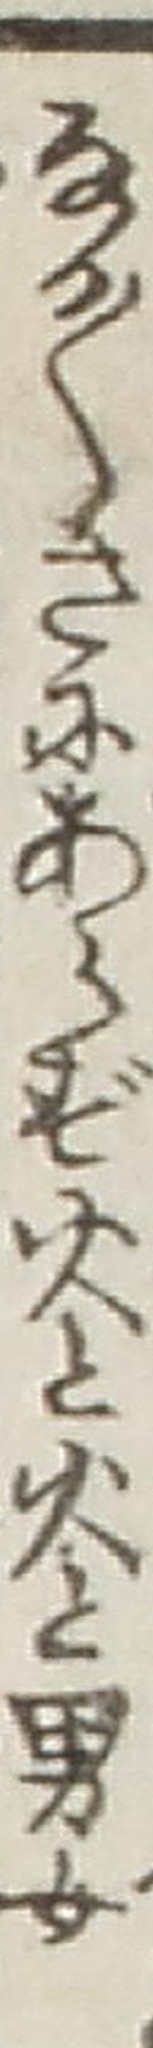なか〳〵さにあらず火と火と男女
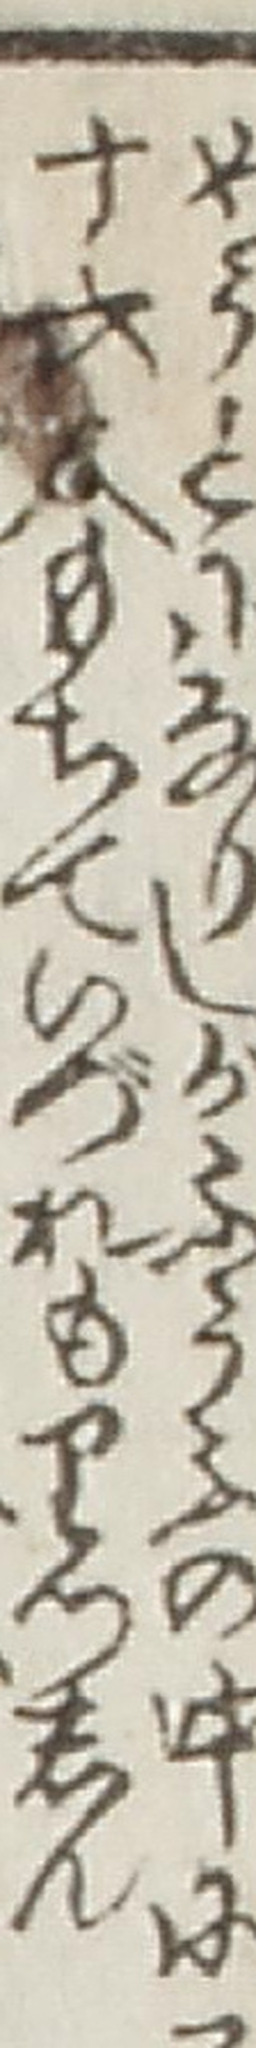十六人もちていづれもりつしん
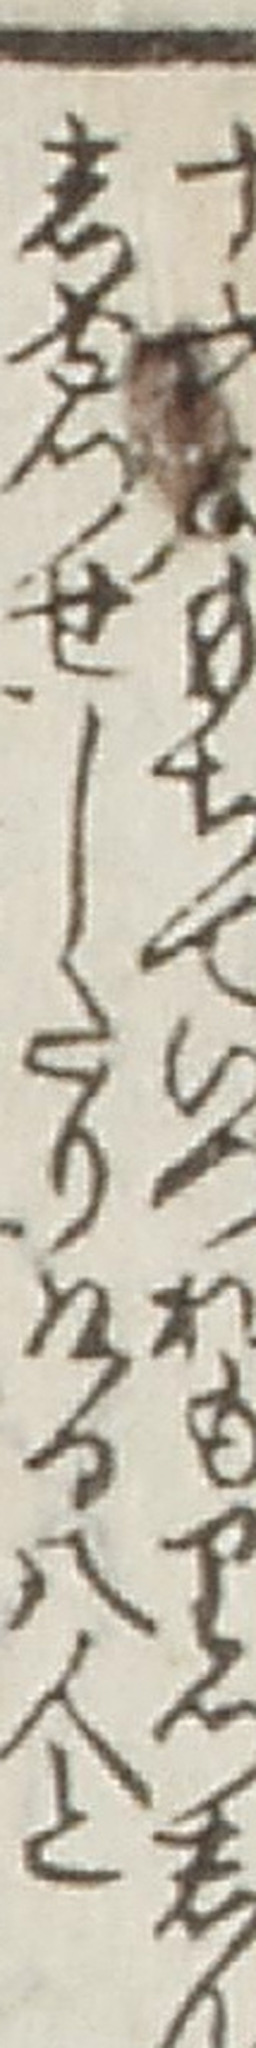しゆつせしたりける八人と
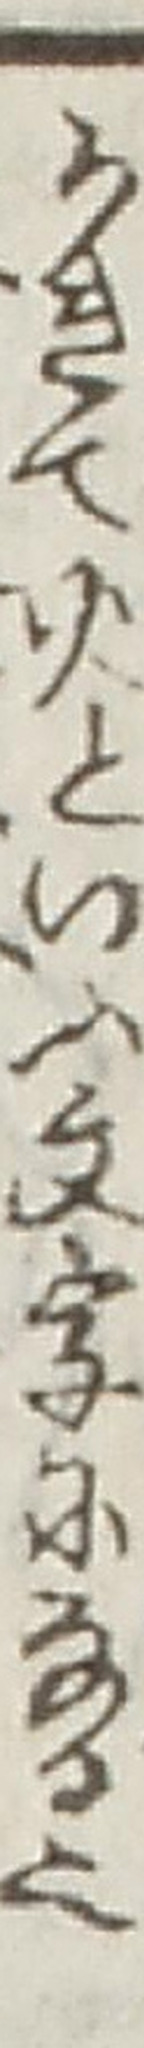かきて火といふ文字になるニ
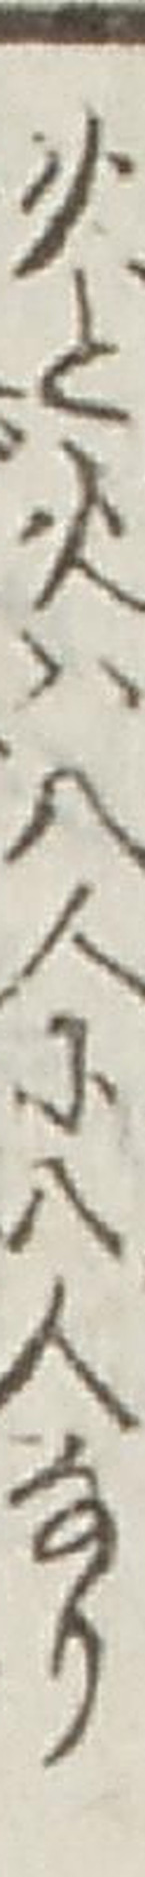火と火ハ八人に八人なり
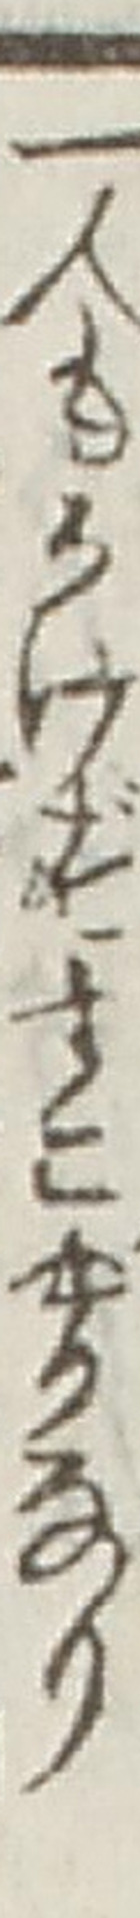一人もかけずすこやかなり
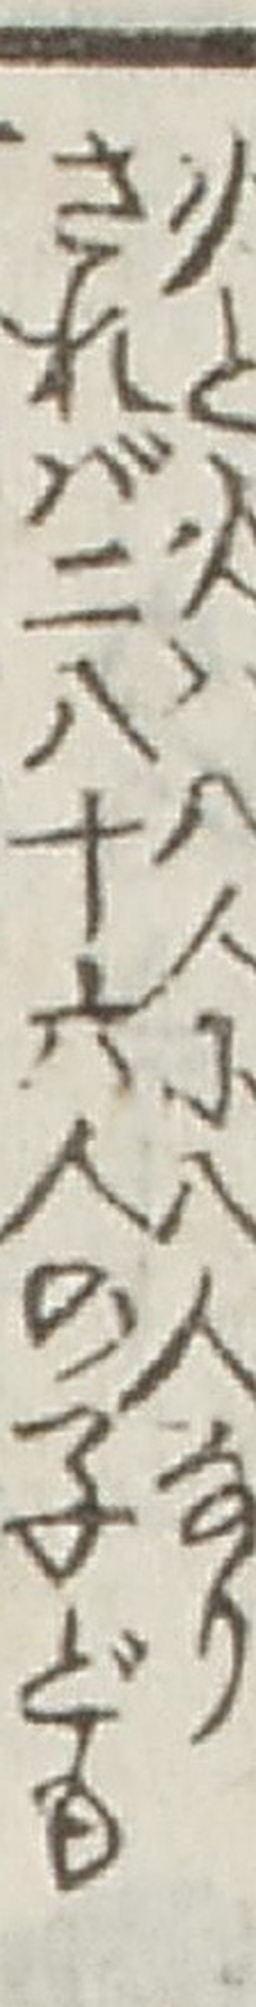されば二八十六人の子ども
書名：三世相出雲當座帳　上下冊
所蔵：東京大学地震研究所図書室 Earthquake Research Institute Library, The University of Tokyo, JAPAN
